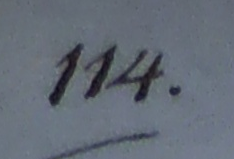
114.
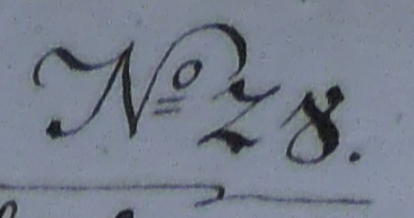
No͇ 28.
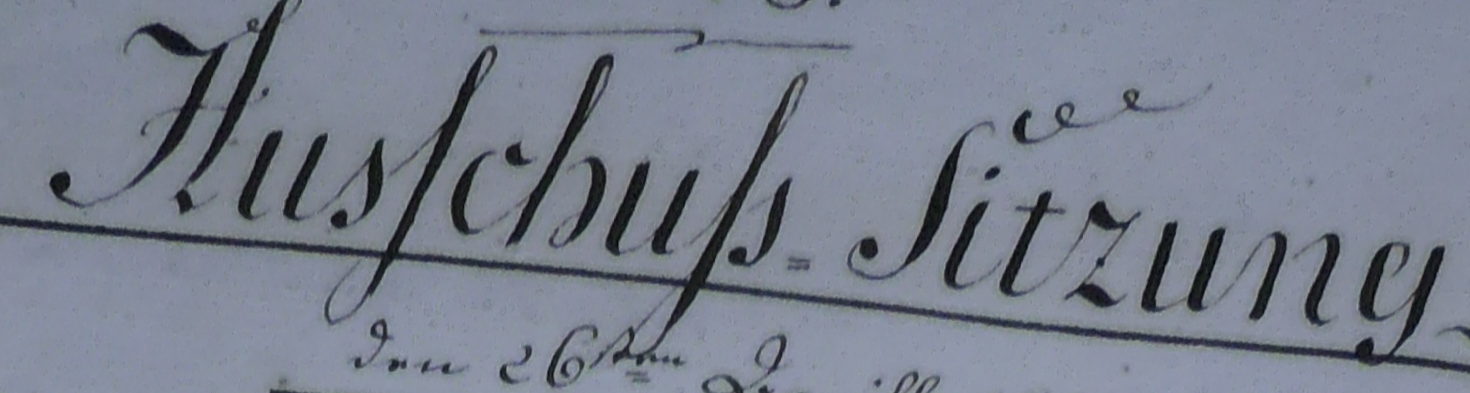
Ausschuss‗Sitzung
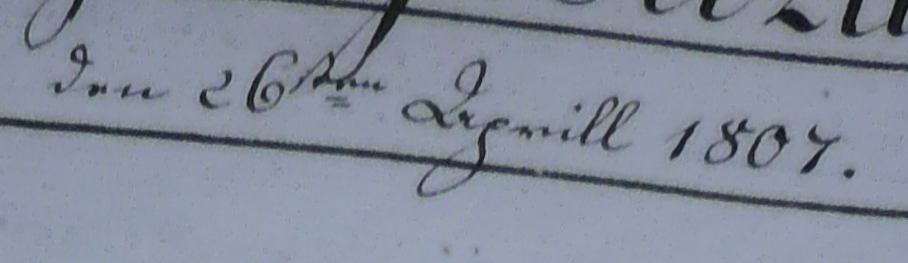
den 26ste͇n Aprill 1807.
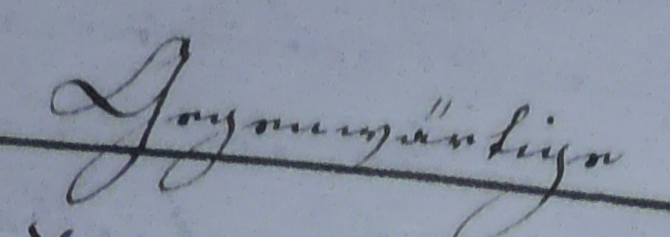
Gegenwärtige
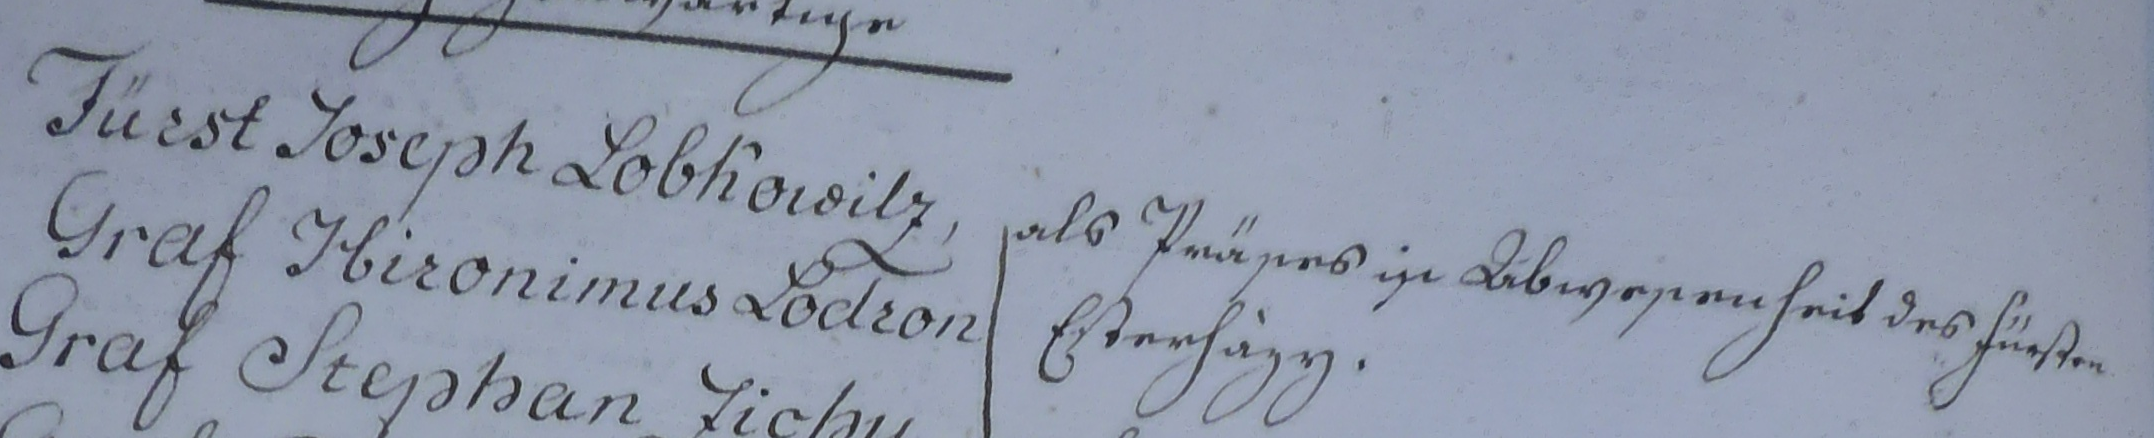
Fürst Joseph Lobkowitz, als Präses in Abwesenheit des Fürsten
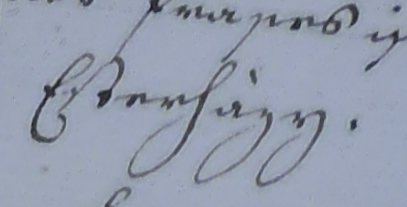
Esterhàzy.
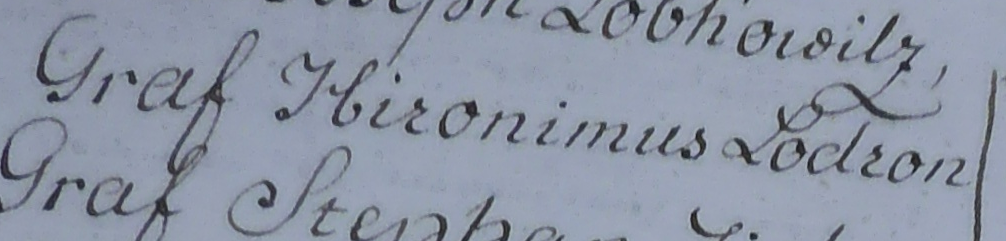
Graf Hironimus Lodron
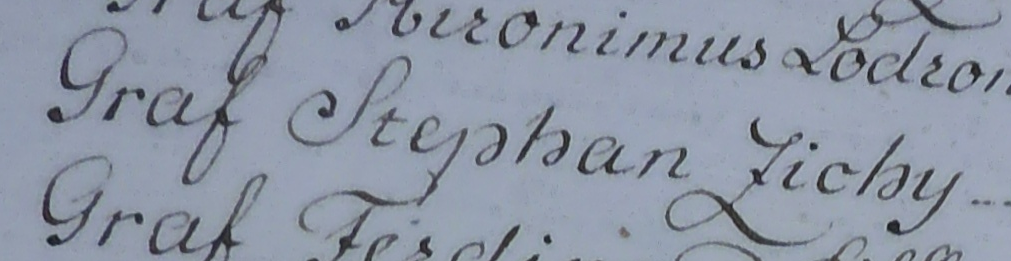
Graf Stephan Zichy.
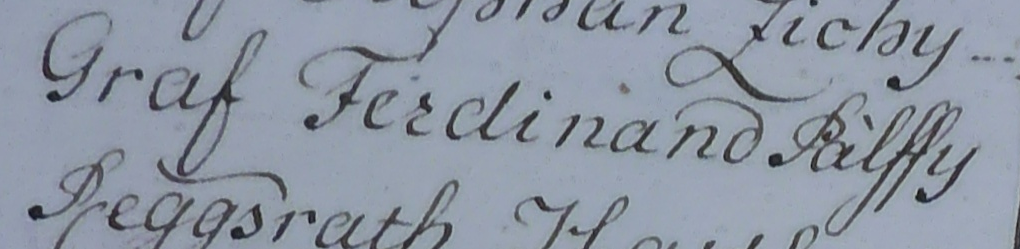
Graf Ferdinand Pàlffy
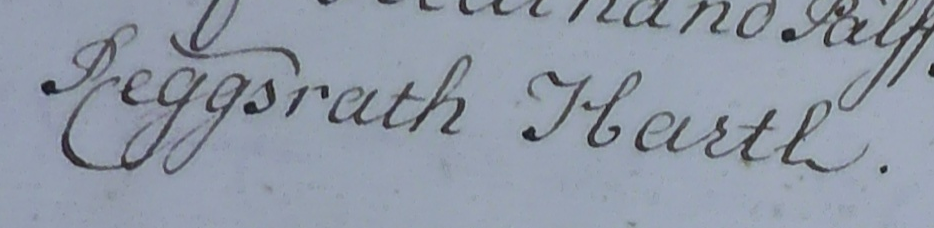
Reg͞gsrath Hartl.
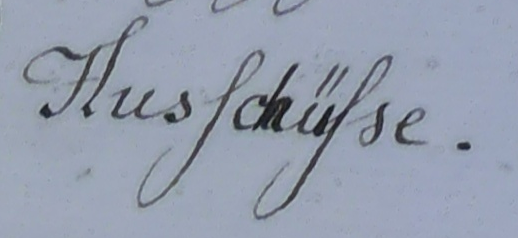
Ausschüsse.
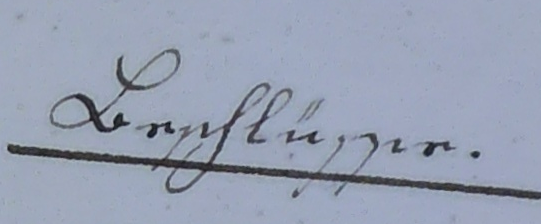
Beschlüsse.
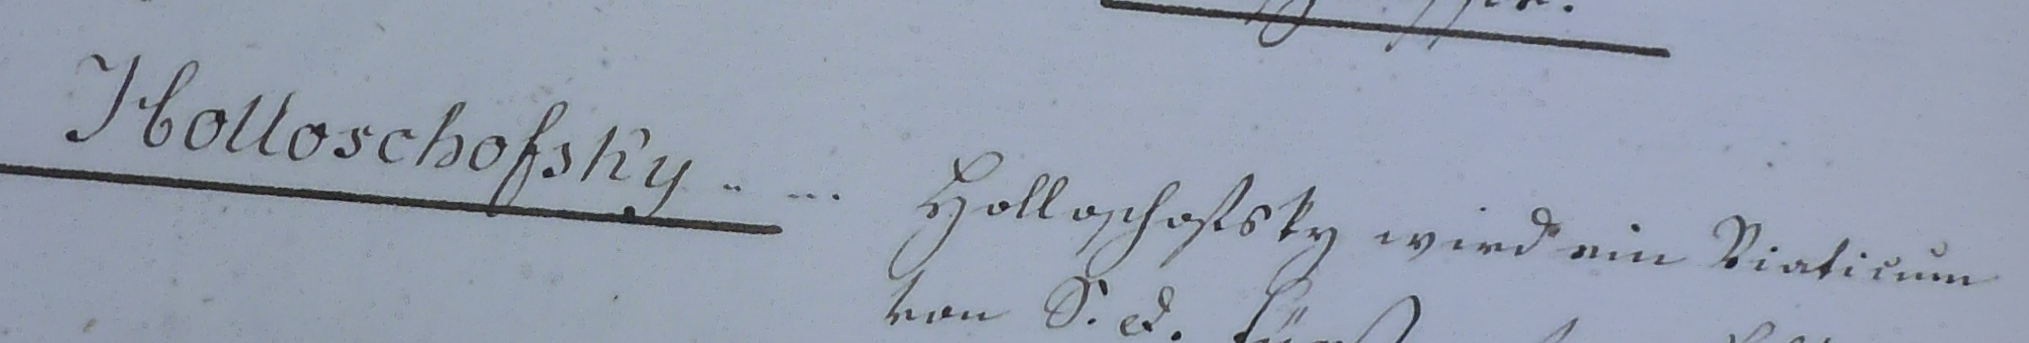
Holloschofsky .. ... Holloschofsky wird ein Viaticum
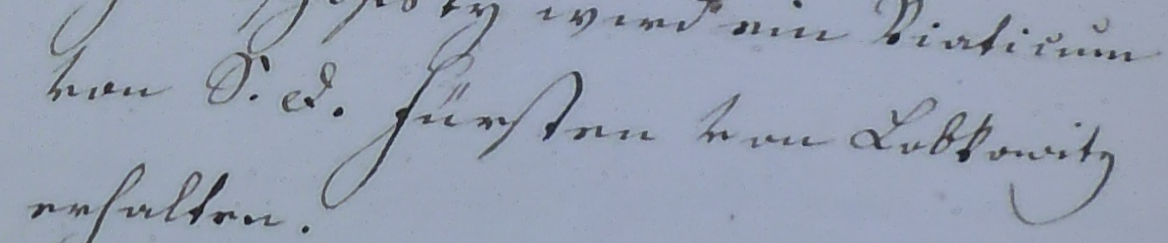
von S. D. Fürsten von Lobkowitz
